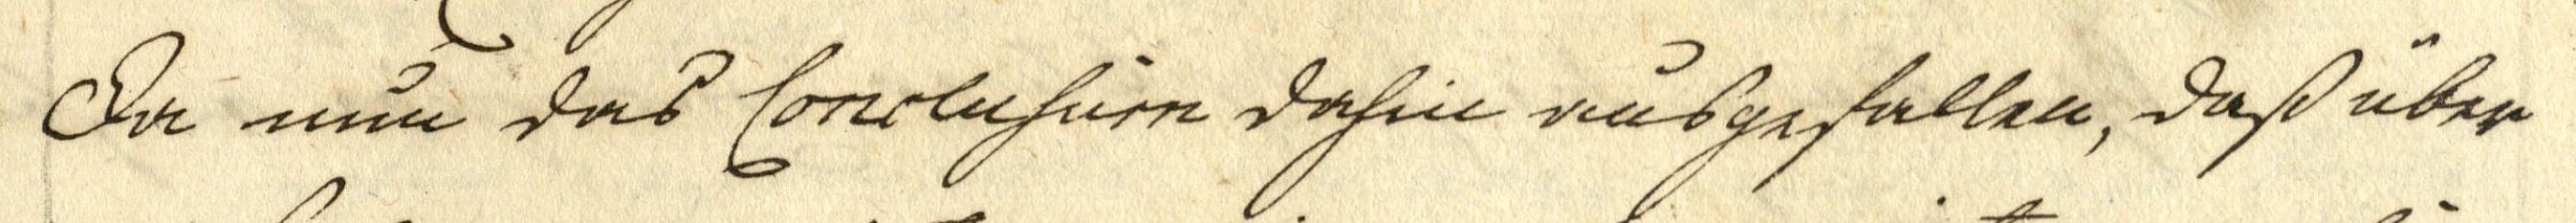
Da nun das Conclusum dahin ausgefallen, daß über
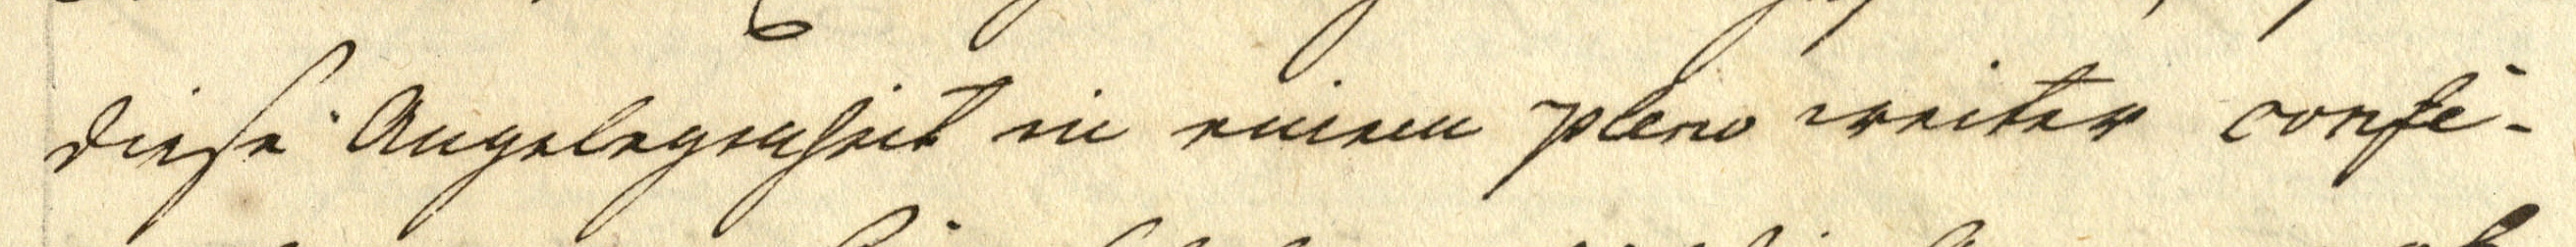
diese Angelegenheit in einem pleno weiter confe-
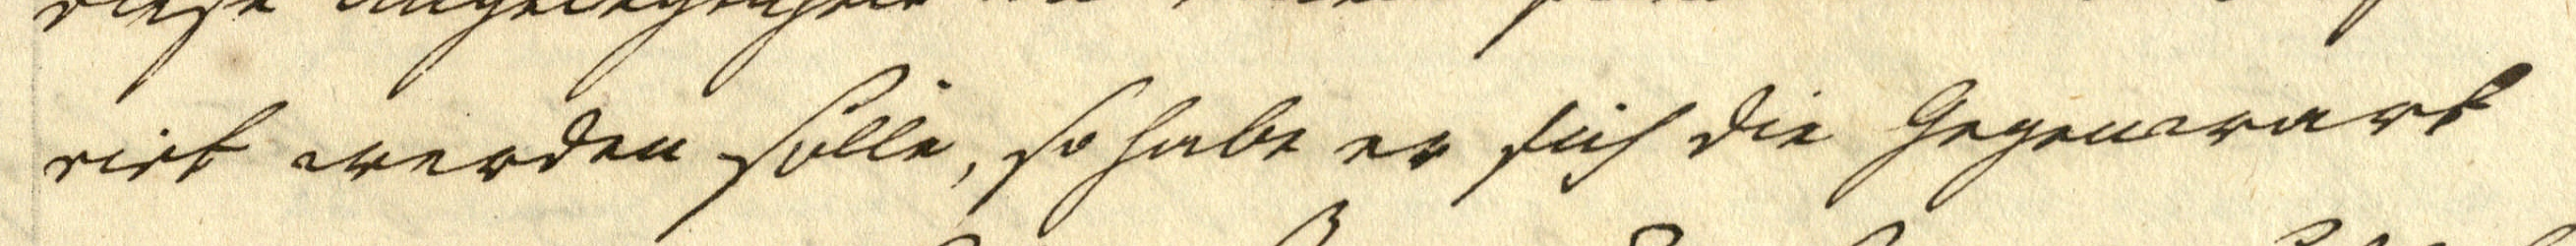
rirt werden solle, so habe er sich die Gegenwart
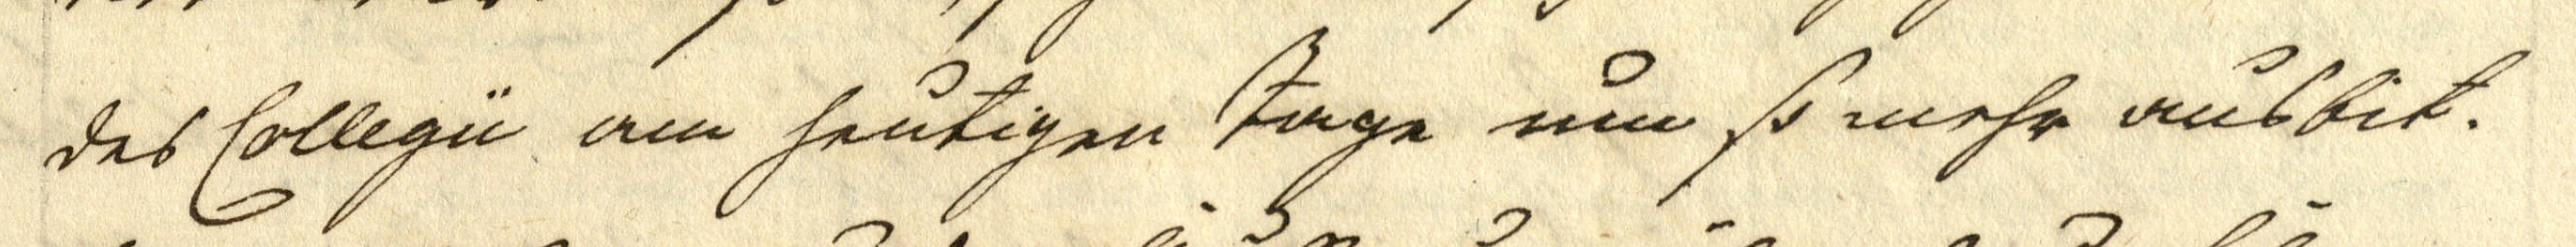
des Collegii am heutigen Tage um so mehr ausbit-
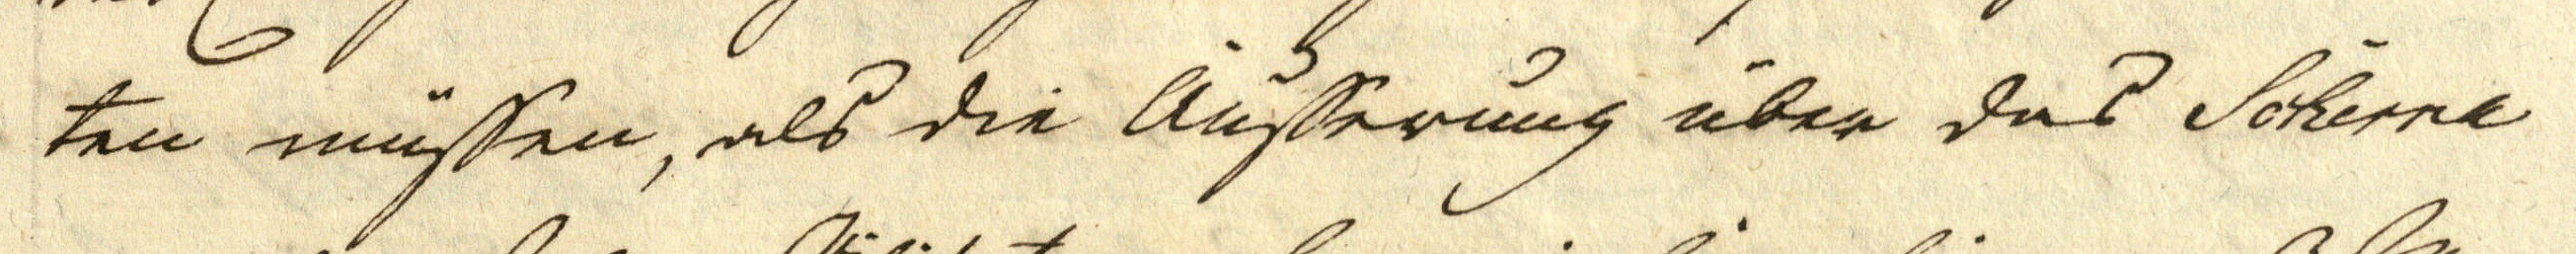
ten müssen, als die Äusserung über das Schema
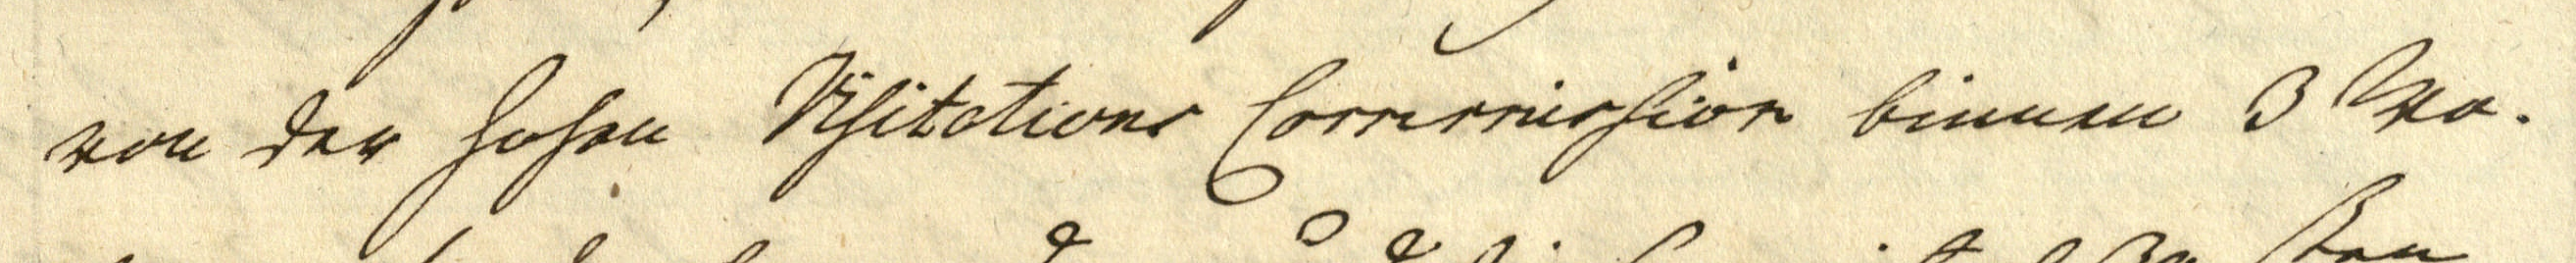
von der hohen Visitations Commission binnen 3 Wo-
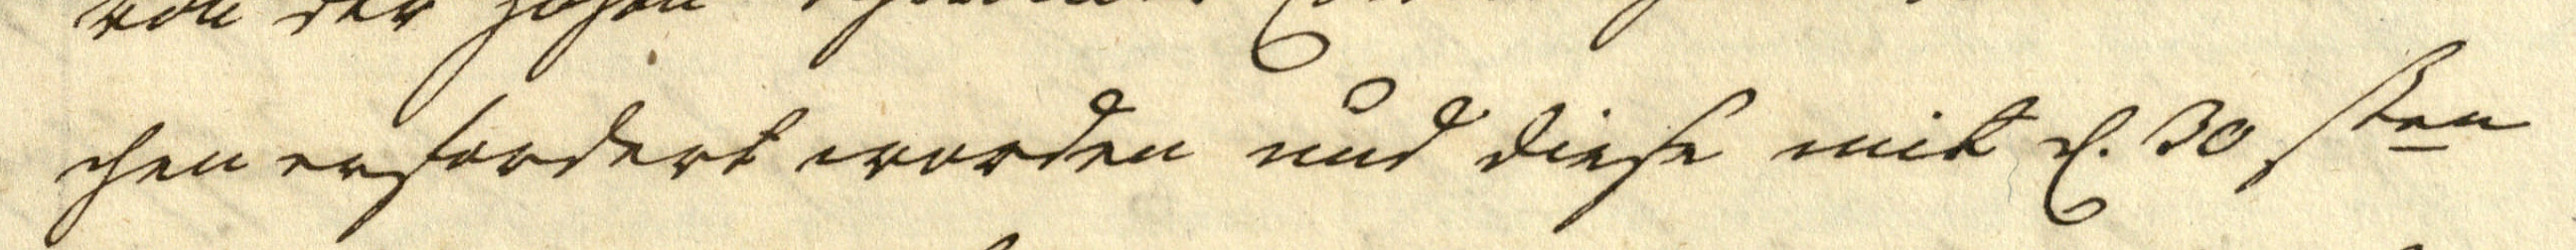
chen erfordert wurden und diese mit d. 30sten
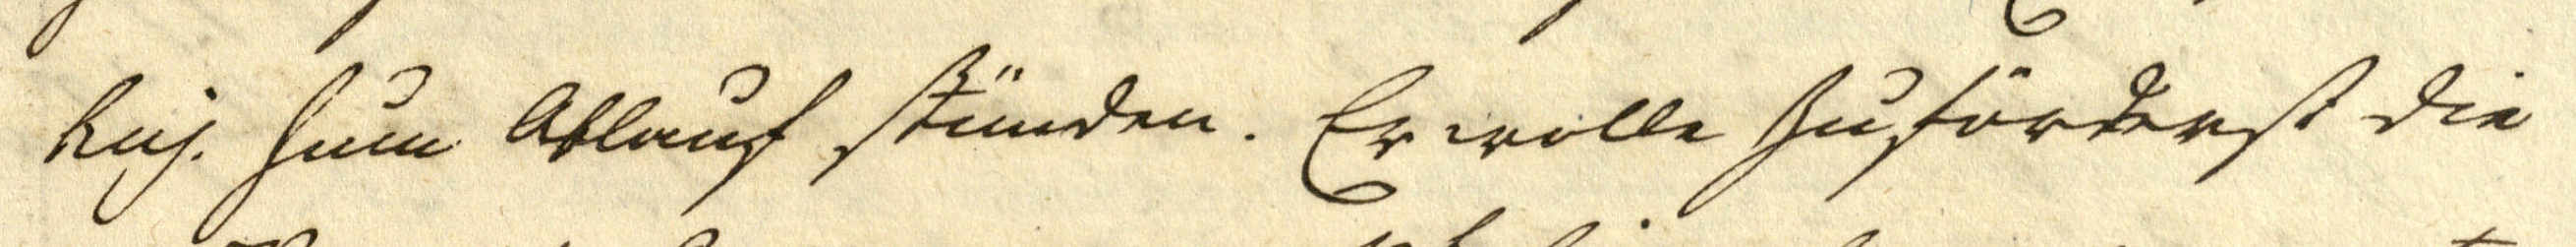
huj. zum Ablauf stünden. Er wolle zuförderst die
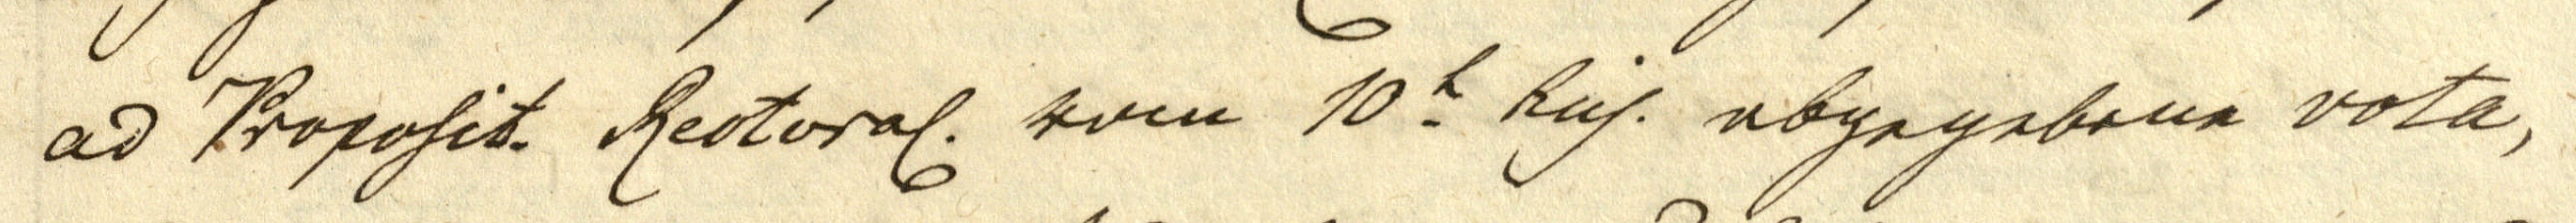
ad Proposit. Rectoral. vom 10t huj. abgegebene vota,
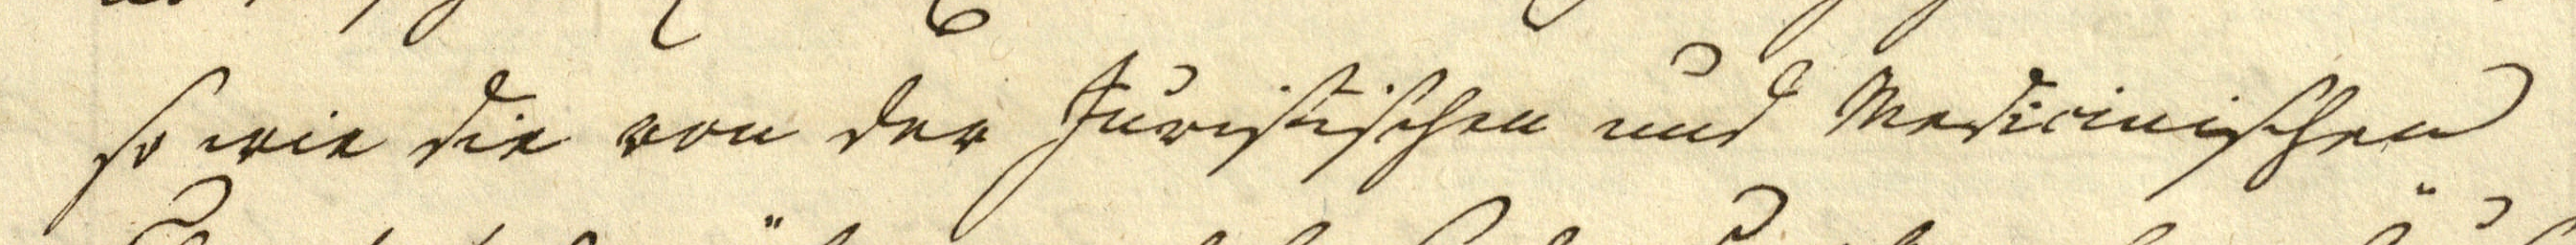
so wie die von der Juristischen und Medicinischen
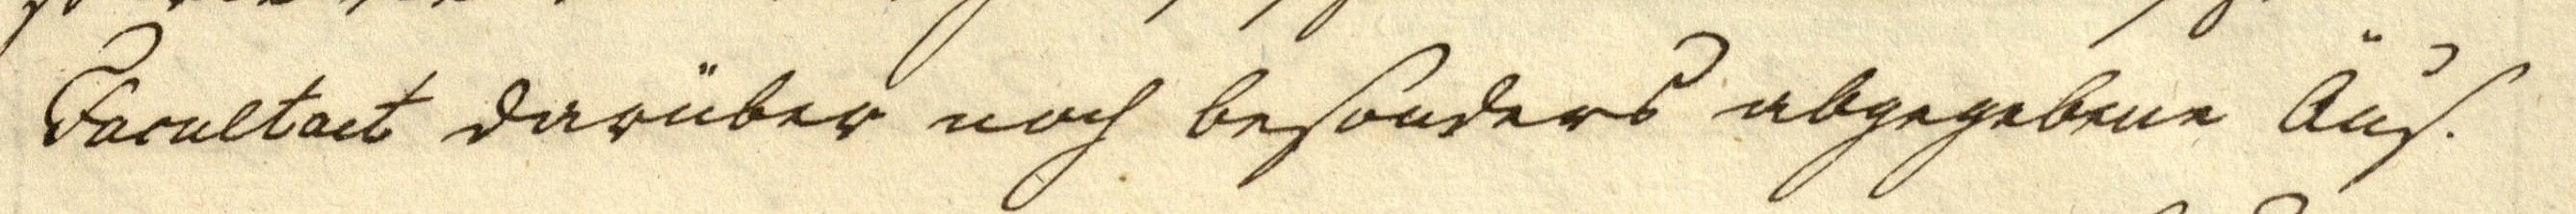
Facultaet darüber noch besonders abgegebene Äus-
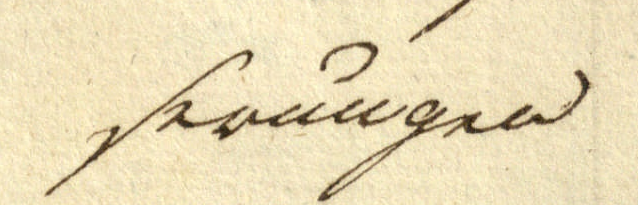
serungen
